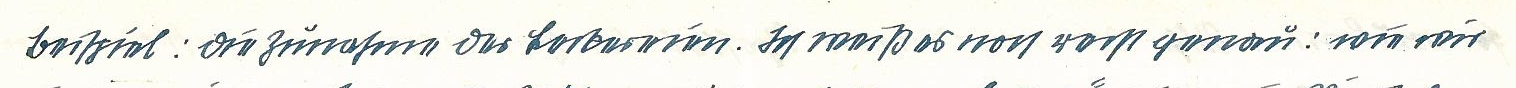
Beispiel: die Zunahme der Leckereien. Ich weiß es noch ganz genau: wie wir
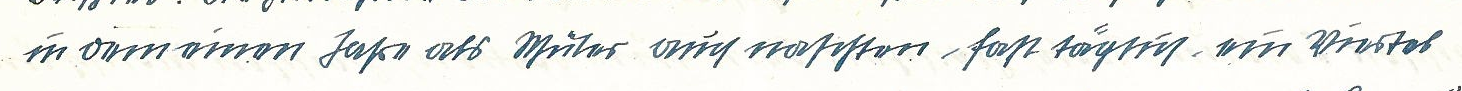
in dem einen Jahre als Schüler auch naschten, fast täglich, ein Viertel
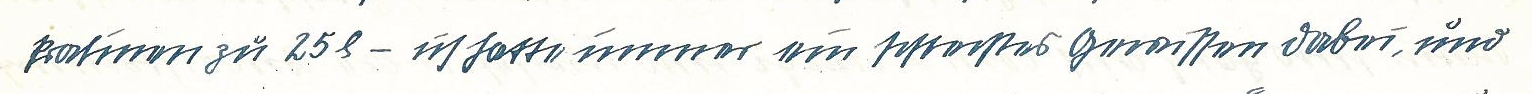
Pralinen zu 25 – ich hatte immer ein schlechtes Gewissen dabei, und
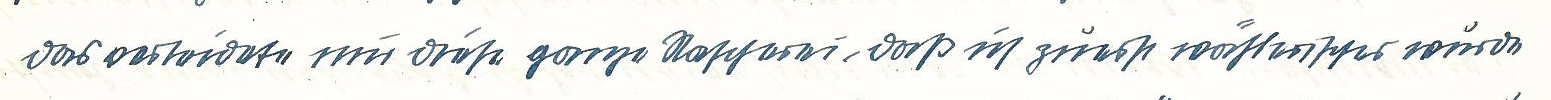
das verleidete mir diese ganze Nascherei, daß ich zuerst wählerischer wurde
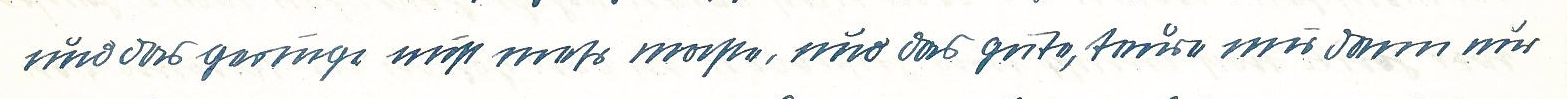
und das geringe nicht mehr mochte, und das gute, teure mir dann nur
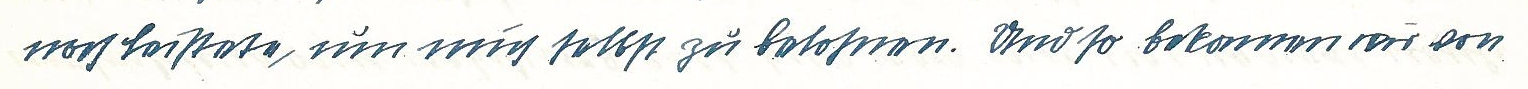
noch leistete, um mich selbst zu belohnen. Und so bekommen wir von
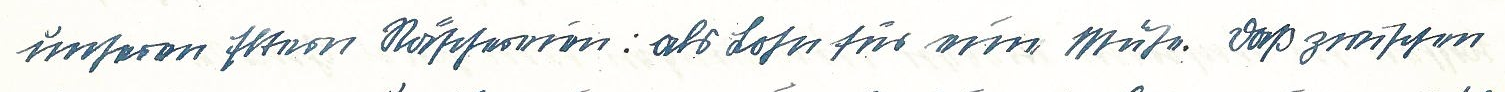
unseren Eltern Näschereien: als Lohn für eine Mühe. Daß zwischen
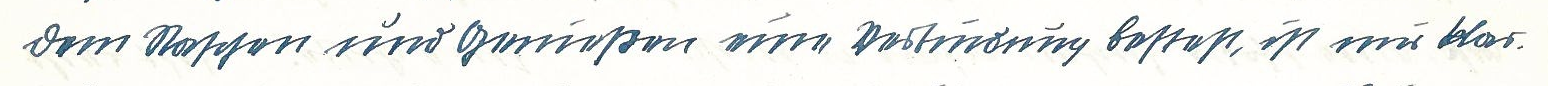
dem Naschen und Genießen eine Verbindung besteht, ist mir klar.
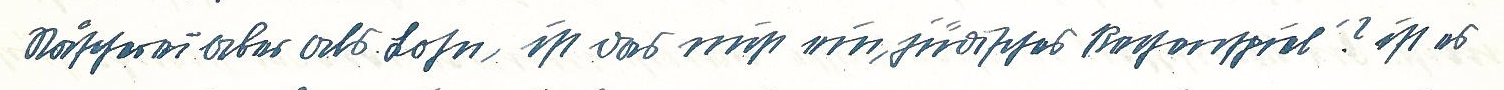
Näscherei aber als Lohn, ist das nicht ein ‚jüdisches Rechenspiel’? ist es
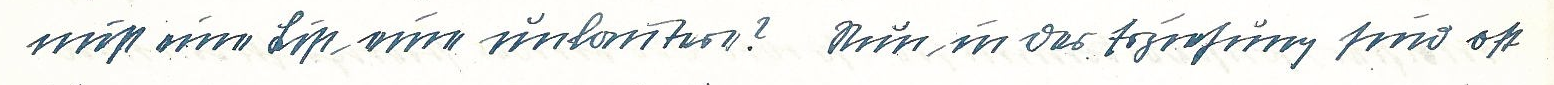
nicht eine List, eine unlautere? Nun, in der Erziehung sind oft
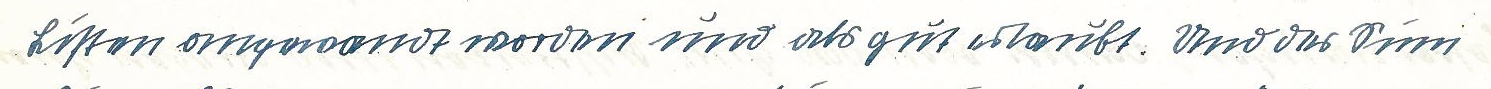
Listen angewandt worden und als gut erlaubt. Und der Sinn
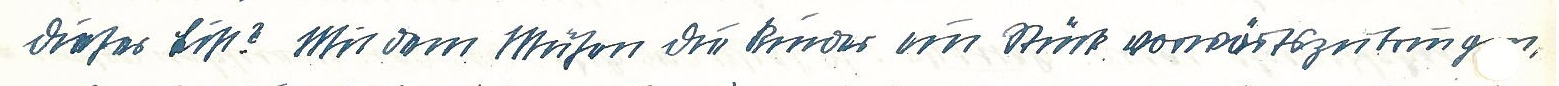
dieser List? Mit dem Mühen, die Kinder ein Stück vorwärtszubringn,
